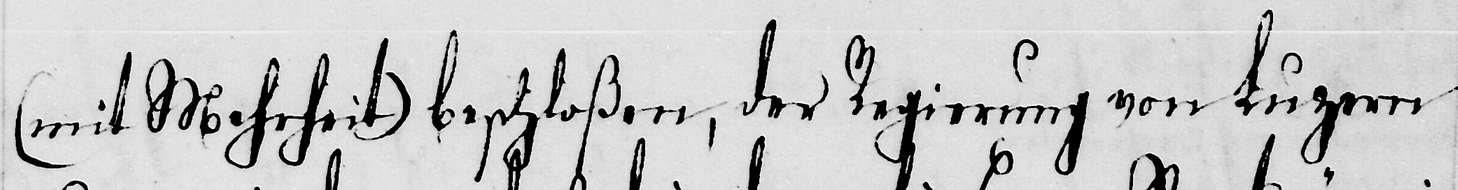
(mit Mehrheit) beschloßen, der Regierung von Luzern
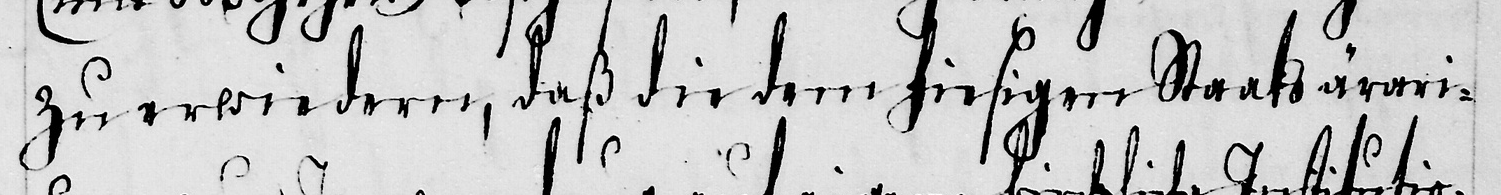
zu erwiedern, daß die dem hiesigen Staatsärari¬
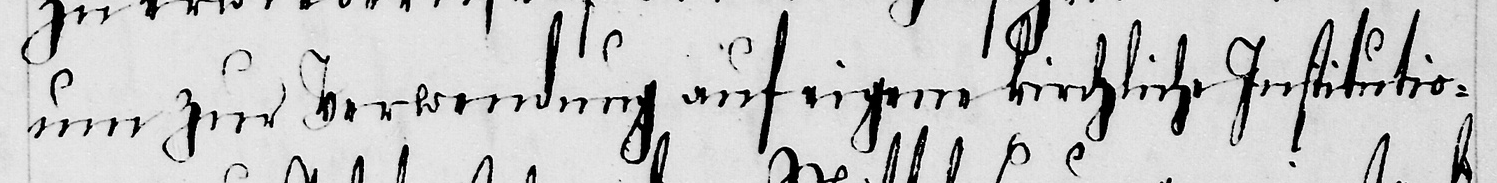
um zur Verwendung auf eigene kirchliche Institutio¬
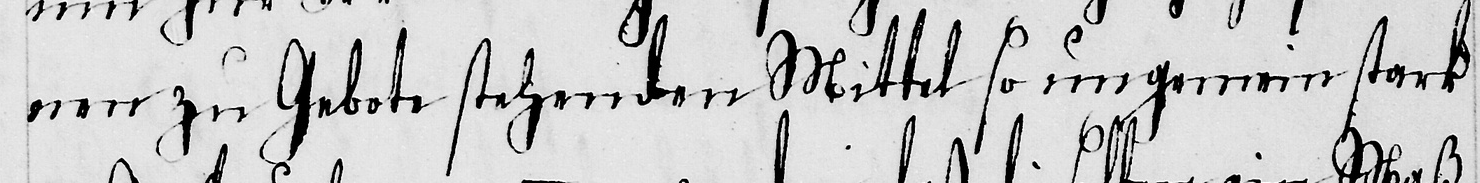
nen zu Gebote stehenden Mittel so ungemein stark
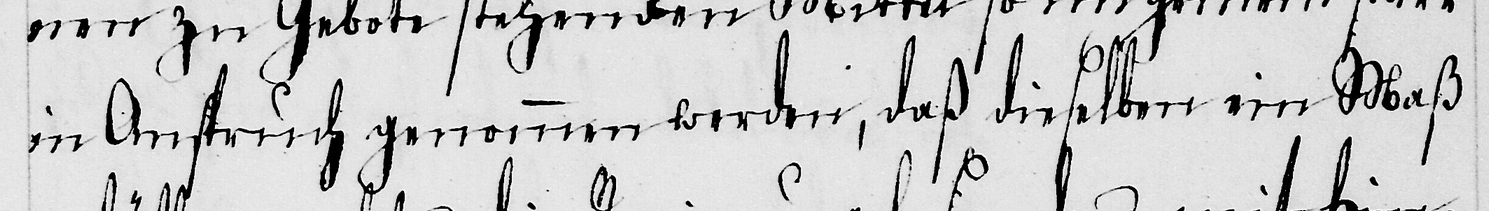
in Anspruch genommen werden, daß dieselben ein Maß
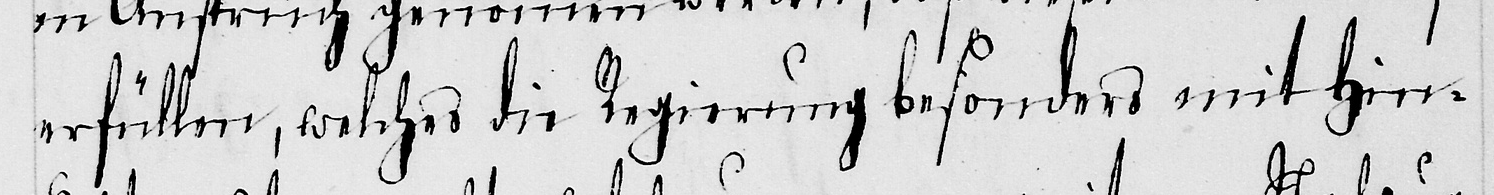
erfüllen, welches die Regierung besonders mit Hin¬
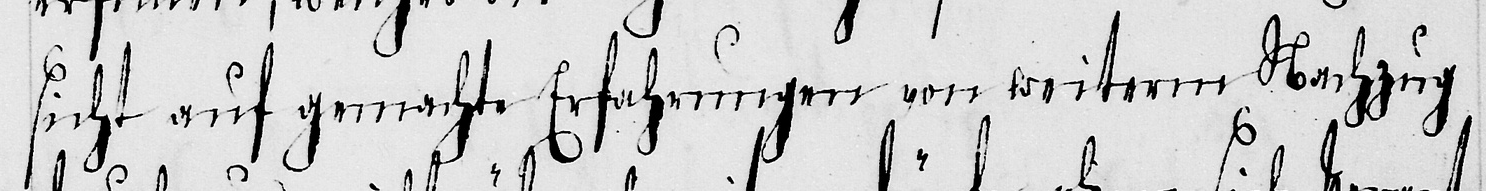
sicht auf gemachte Erfahrungen von weiterm Nachzug
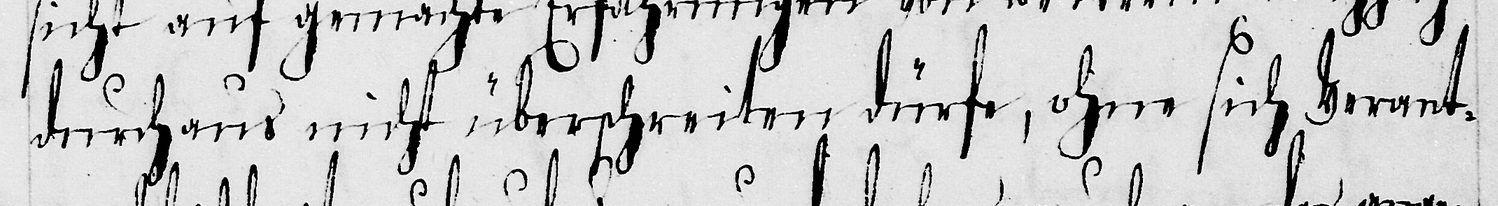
durchaus nicht überschreiten dürfe, ohne sich Verant¬
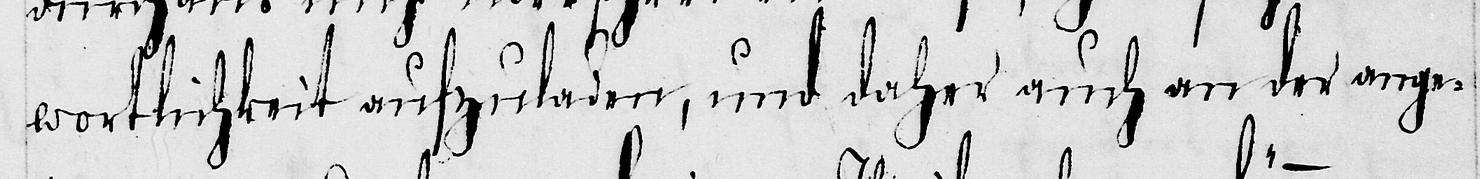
wortlichkeit aufzuladen, und daher auch an der ange¬
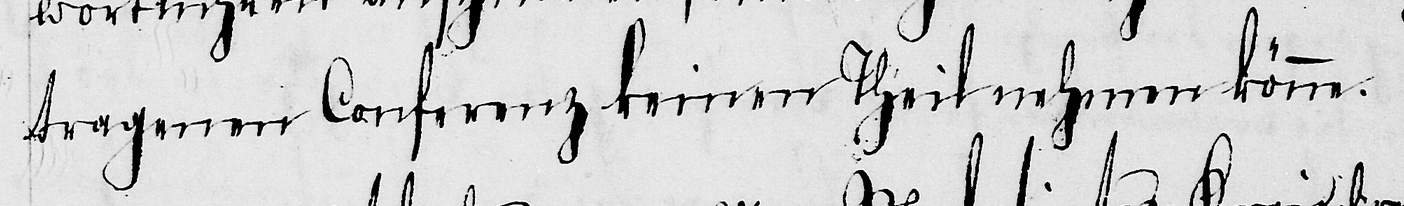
tragenen Conferenz keinen Theil nehmen könne.
